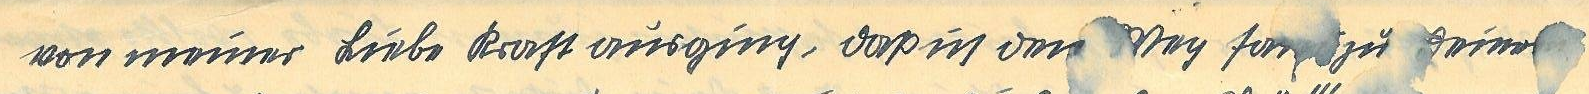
von meiner Liebe Kraft ausging, daß ich den eg fa zu Deine
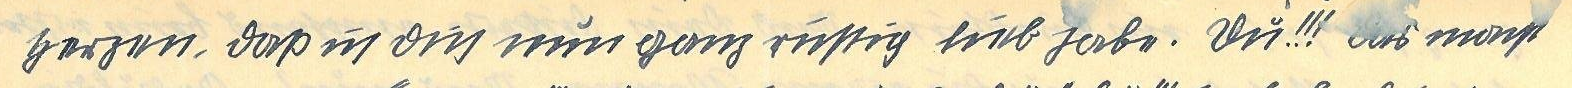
Herzen, daß ich Dich nun ganz richtig lieb habe. Du!!! Das macht
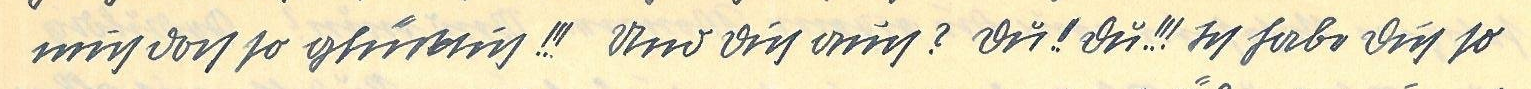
mich doch so glücklich!!! Und Dich auch? Du!! Du!!! Ich habe Dich so
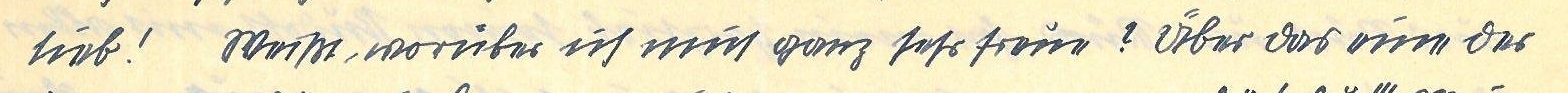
lieb! Weißt, worüber ich mich ganz sehr freue? Über das eine der
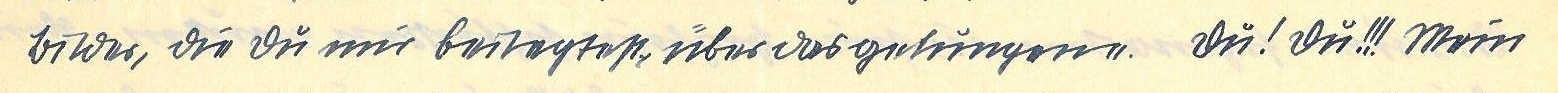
Bilder, die Du mir beilegtest, über das gelungene. Du! Du!!!! Mein
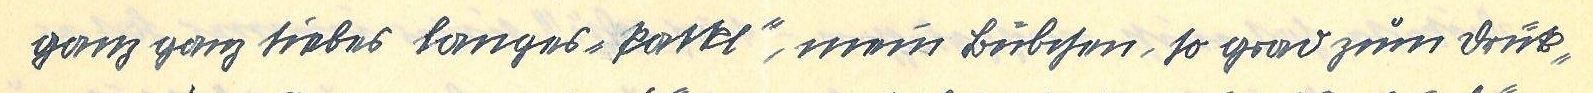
ganz ganz liebes langes „Packl“, mein Bübchen, so grad zum Drüc¬
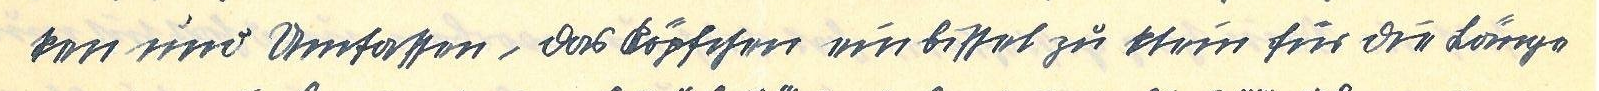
ken uns Umfassen, das Köpfchen ein bissel zu klein für die Länge
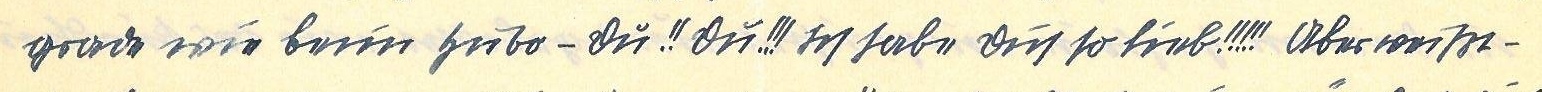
grade wie beim Hubo – Du!! Du!!! Ich habe Dich so lieb!!!!! Aber weißt –
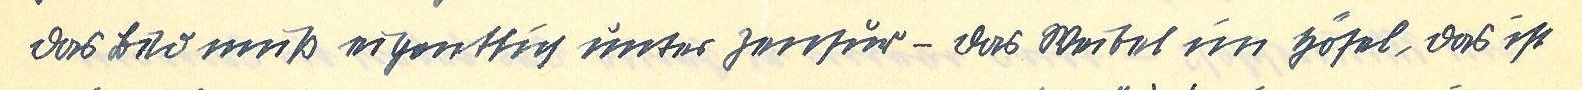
das Bild muß eigentlich unter Zensur – das Weibel im Hösel, das ist
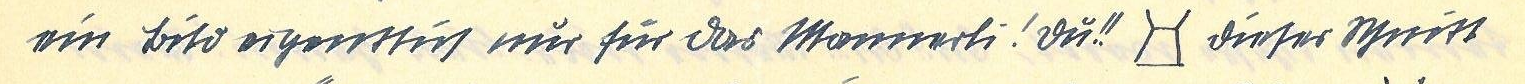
ein Bild eigentlich nur für das Mannerli! Du!! Dieser Schnitt
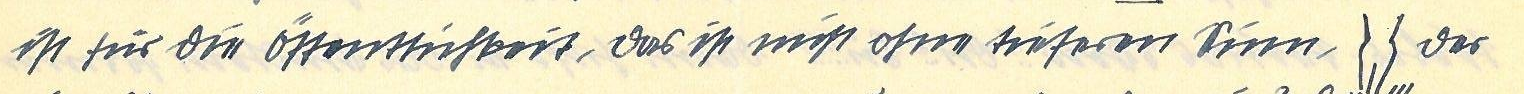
ist für die Öffentlichkeit, das ist nicht ohne tieferen Sinn, der
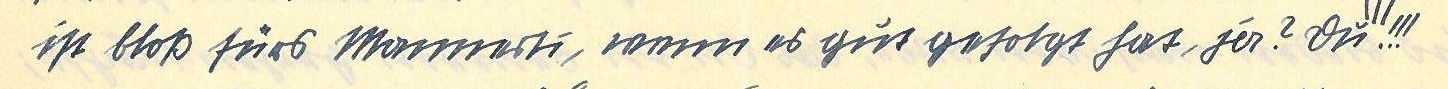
ist bloß fürs Mannerli, wenn es gut gefolgt hat, ja? Du!!!
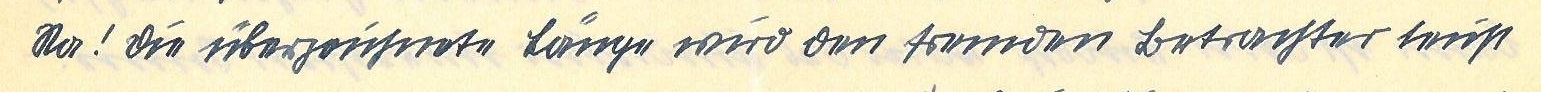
Na! Die überzeichnete Länge wird den fremden Betrachter leicht
